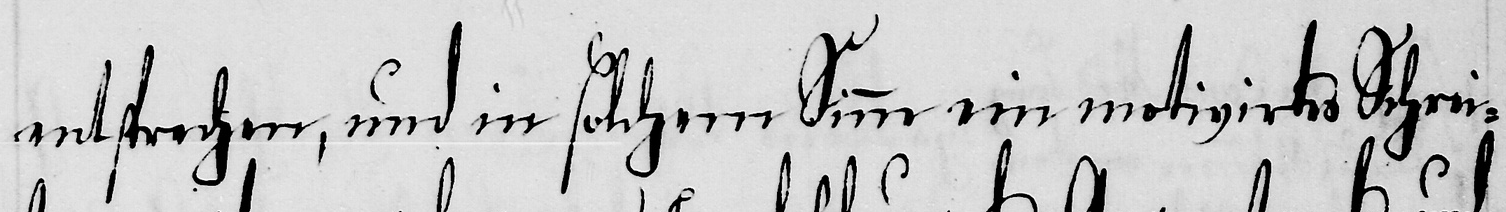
entsprechen, und in solchem Sinne ein motivirtes Schrei¬
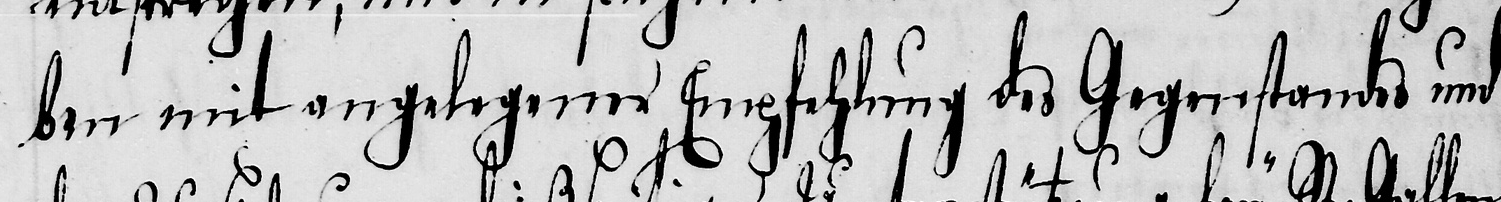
ben mit angelegener Empfehlung des Gegenstandes und
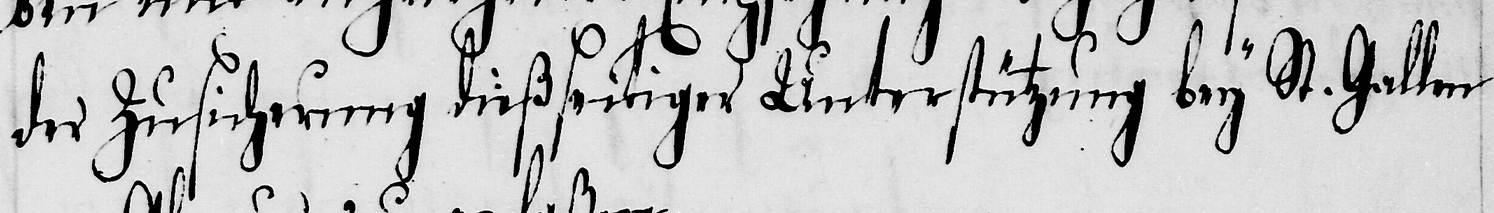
der Zusicherung dießseitiger Unterstützung bey St. Gallen
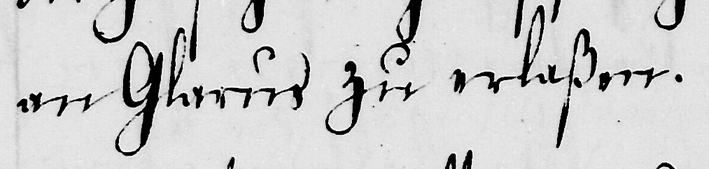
an Glarus zu erlaßen.
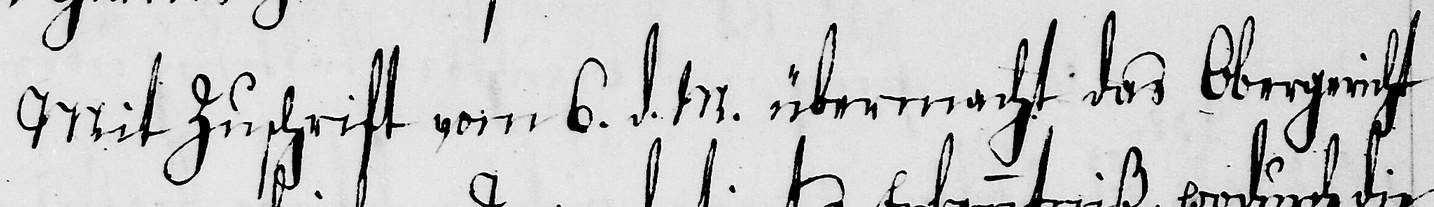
Mit Zuschrift vom 6. d. M. übermacht das Obergericht
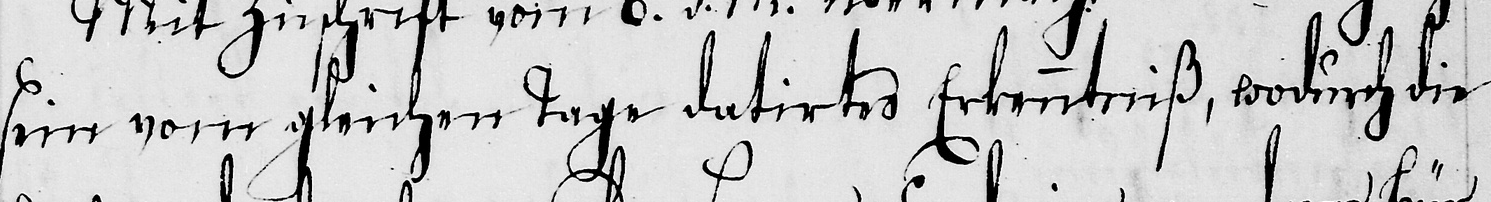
sein vom gleichen Tage datirtes Erkenntniß, wodurch die
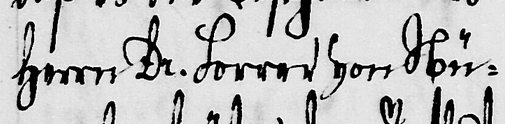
Herrn Dr. Forrer und vi¬
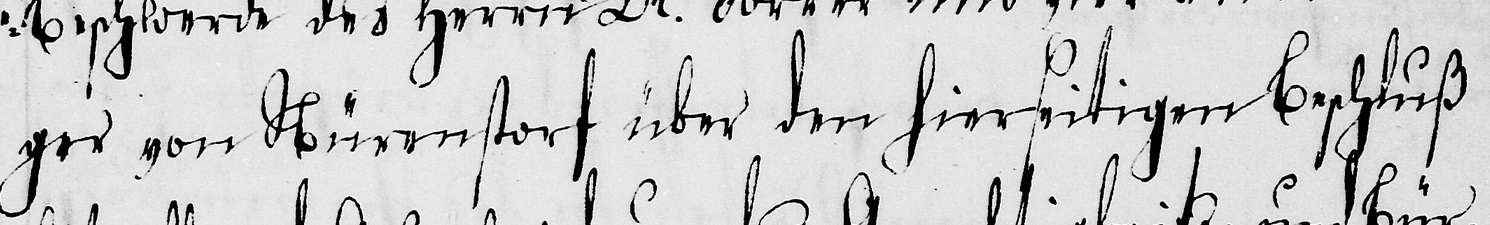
ger von Nürenstorf über den hierseitigen Beschluß
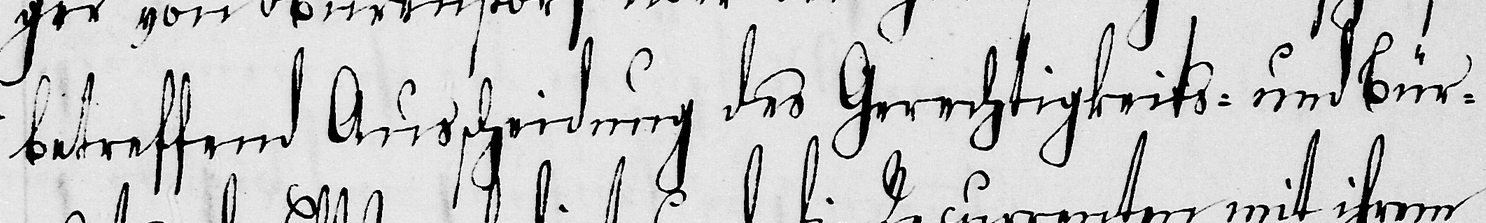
betreffend Ausscheidung des Gerechtigkeits- und Bür¬
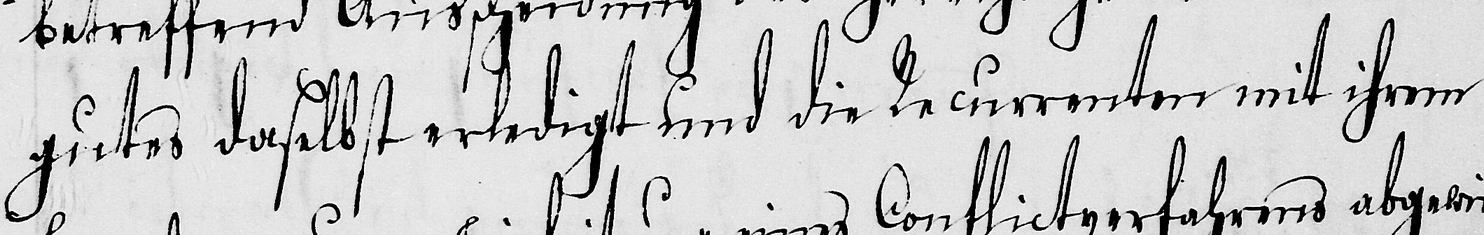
gutes daselbst erledigt und die Recurrenten mit ihrem
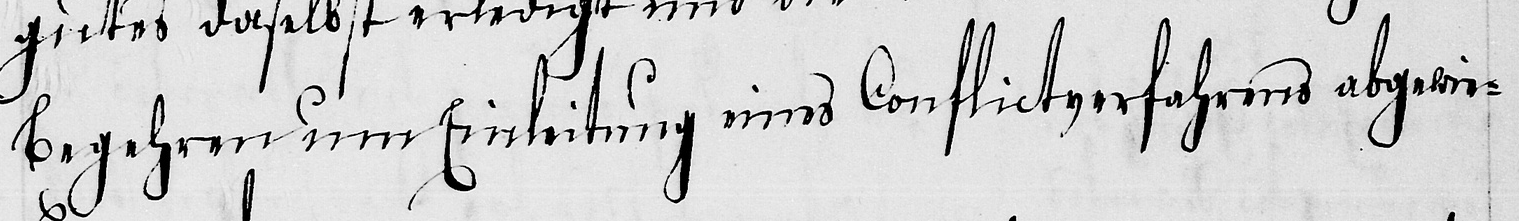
Begehren um Einleitung eines Conflictverfahrens abgewie¬
